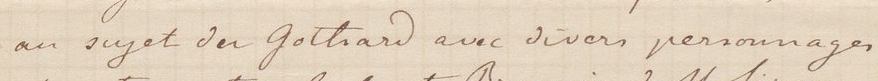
au sujet du Gothard avec divers personnages
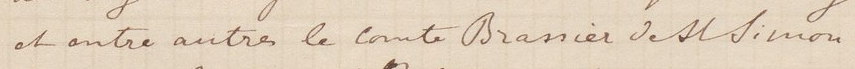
et entre autre le comteBrassier de St Simon,
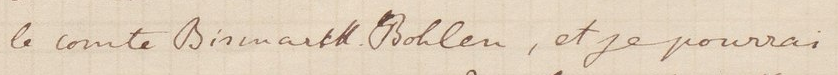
le comte Bismarck-Bohlen, et je pourrai
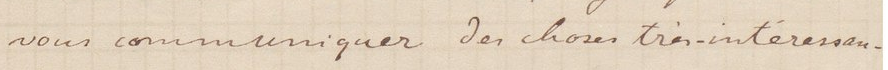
vous communiquer des choses très-intéressan-
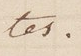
tes. –
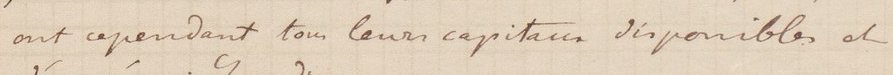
ont cependant tous leurs capitaux disponibles et
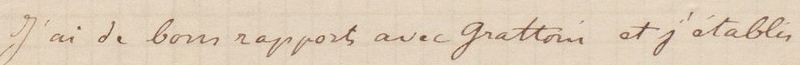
J'ai de bons rapports avec Grattoni et j'établis
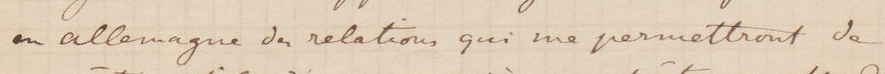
en Allemagne des relations qui me permettront de
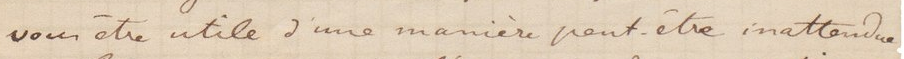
vous être utile d'une manière peut-être inattendue.
